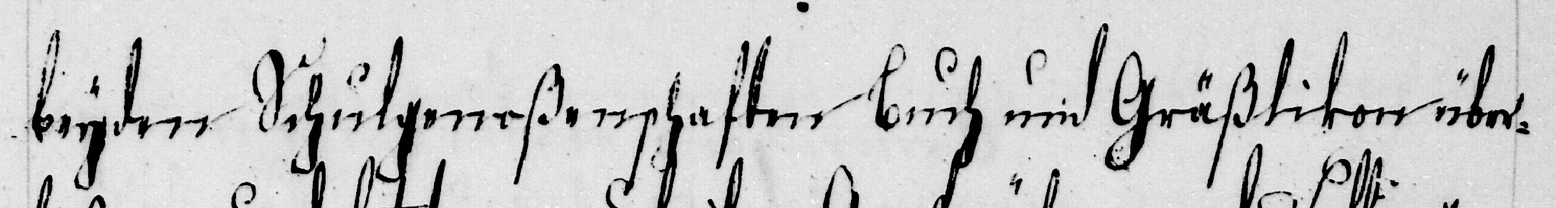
beyden Schulgenoßenschaften Buch und Gräßlikon über¬
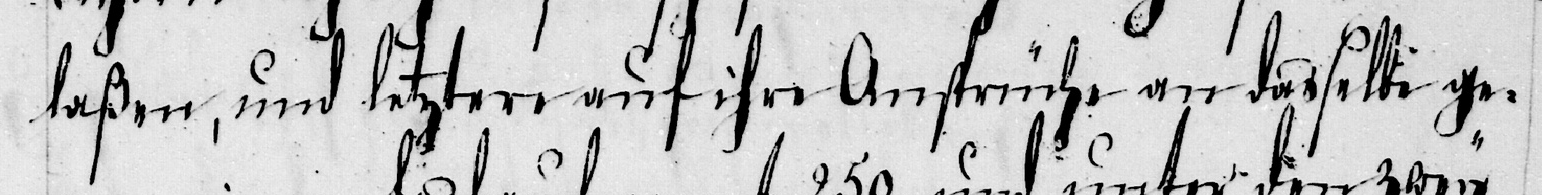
laßen, und letztere auf ihre Ansprüche an dasselbe ge¬
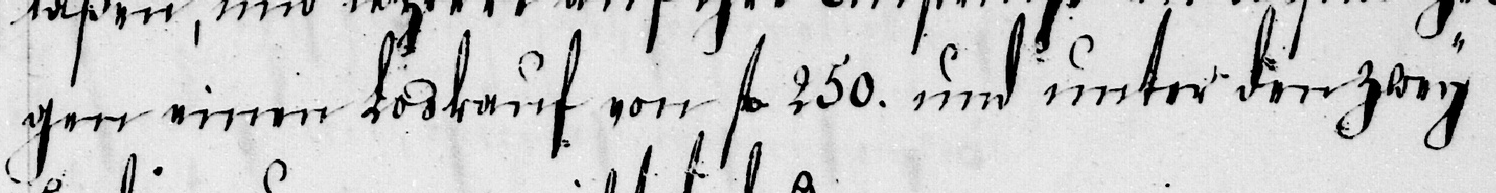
gen einen Loskauf von fl. 250. und unter den zwey
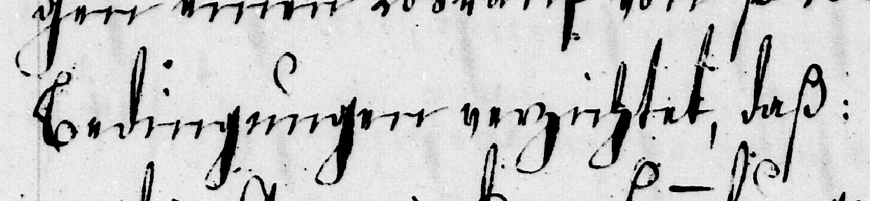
Bedingungen verzichtet, daß:
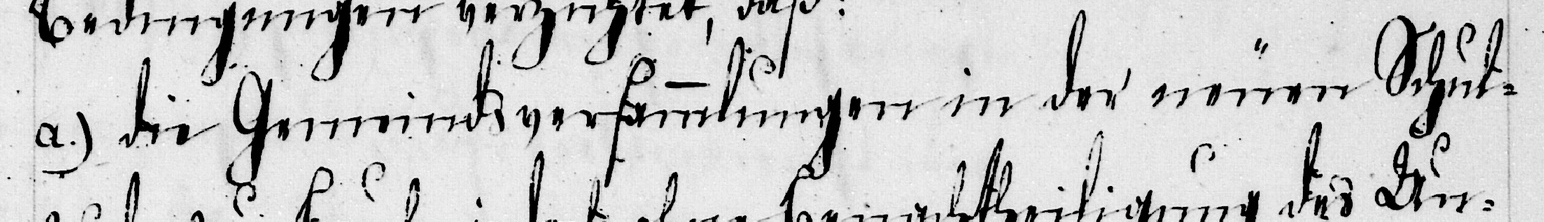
a.) Die Gemeindsversammlungen in der neuen Schul¬
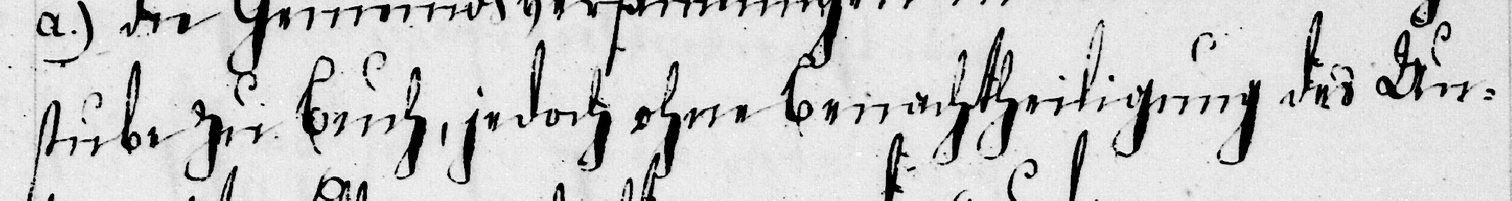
stube zu Buch, jedoch ohne Benachtheiligung des Un¬
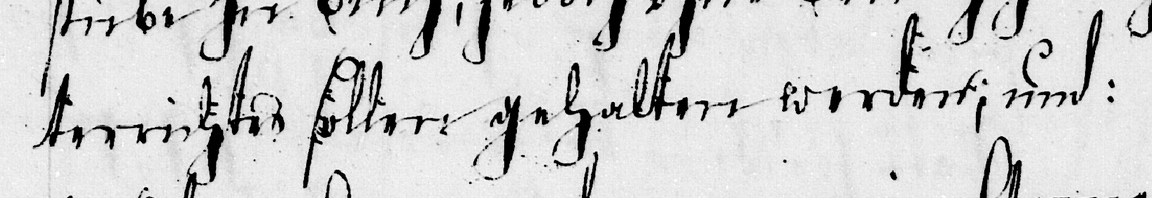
terrichtes sollen gehalten werden, und:
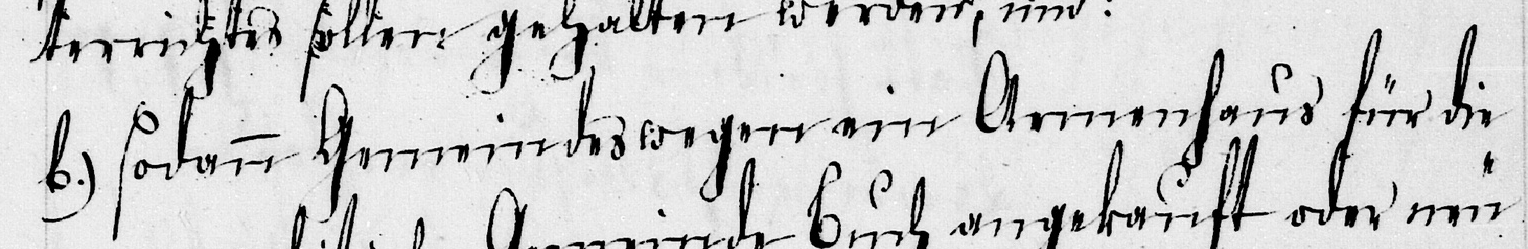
b.) Sodann Gemeindeswegen ein Armenhaus für die
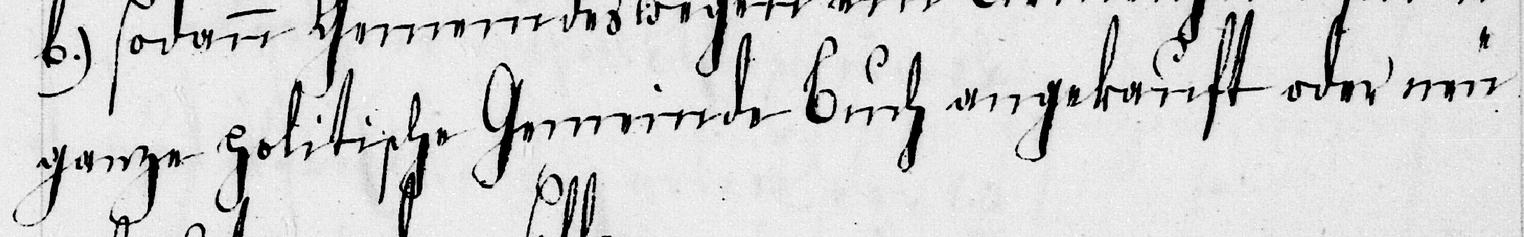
ganze politische Gemeinde Buch angekauft oder neu
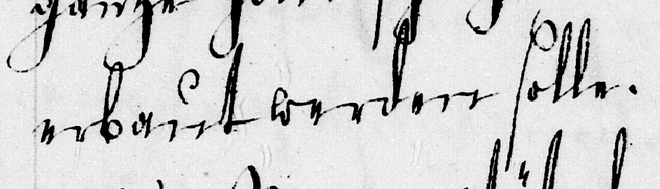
erbaut werden solle.
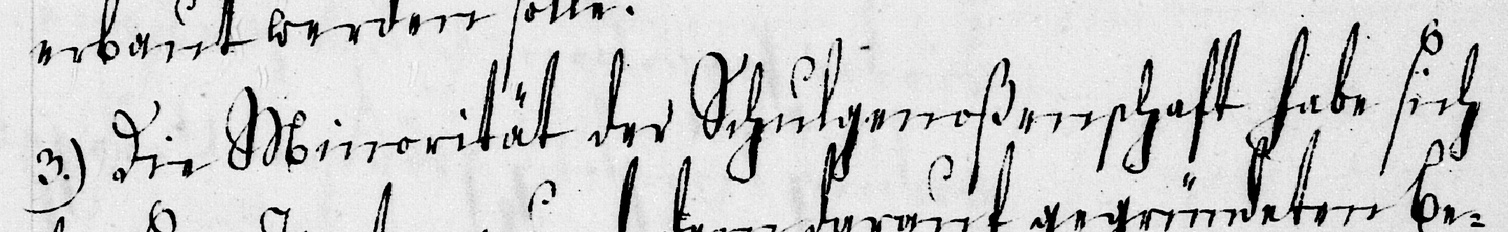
3.) Die Minorität der Schulgenoßenschaft habe sich
